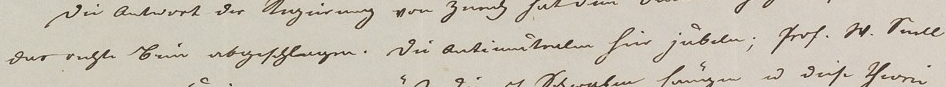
das rechte Bein abgeschlagen. Die Antineutralen hier jubeln; Prof. W. Snell
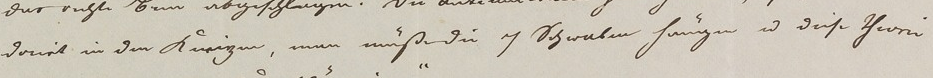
docirt in den Kneipen, man müße die 7 Schwaben hängen u diese Theorie
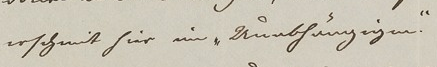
erscheint hier im «Unabhängigen».
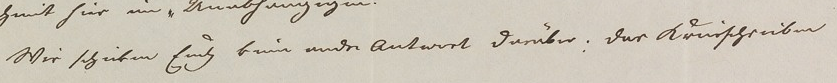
Wir schicken Euch keine andre Antwort darüber. Das Kreisschreiben
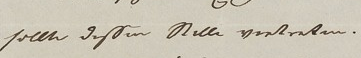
sollte dessen Stelle vertreten.
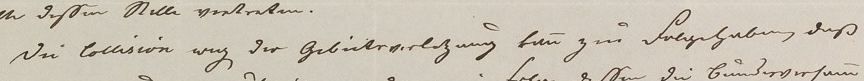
Die Collision wegen der Gebietsverletzung kann zur Folge haben, daß
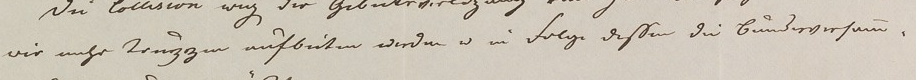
wir mehr Truppen aufbieten werden u in Folge dessen die Bundesversamm-
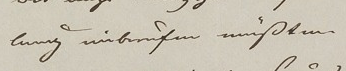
lung einberufen müßten. –
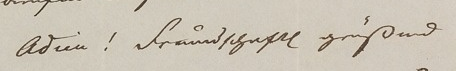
Adieu! Freundschaftlich grüßend
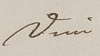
Dein
